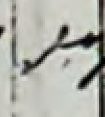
Do
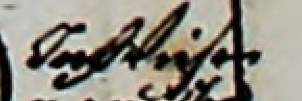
In Wiesen
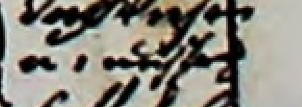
u. unter„
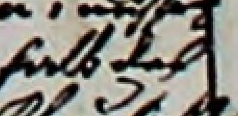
halb des
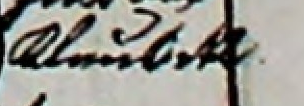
klaus??
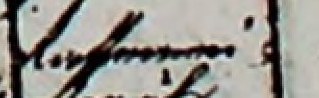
Rassenmei„
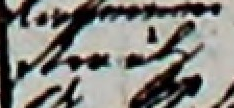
ster ???
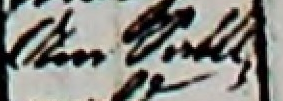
Am Sattl
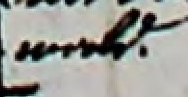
wald.
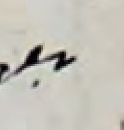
Do
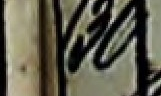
136
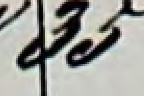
35
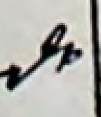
Do
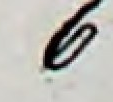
6
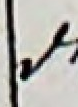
Do
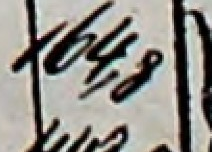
164,8
